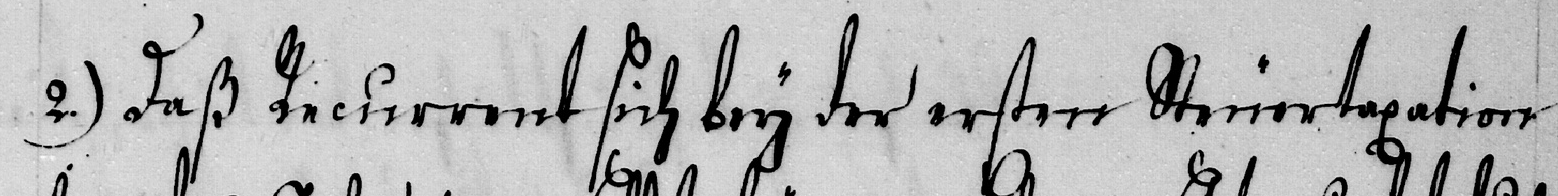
2.) Daß Recurrent sich bey der ersten Steuertaxation
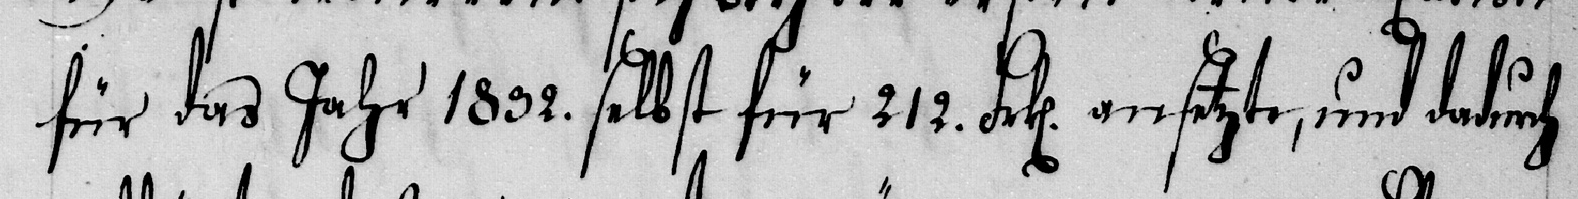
für das Jahr 1832. selbst für 212. Frk[en]. ansetzte,
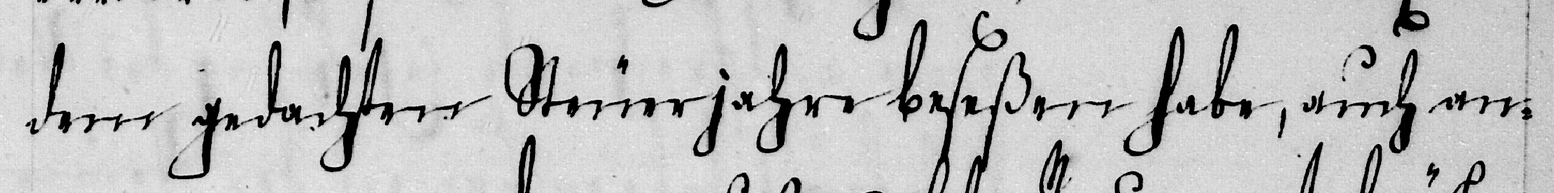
dem gedachten Steuerjahre beseßen habe, auch an¬
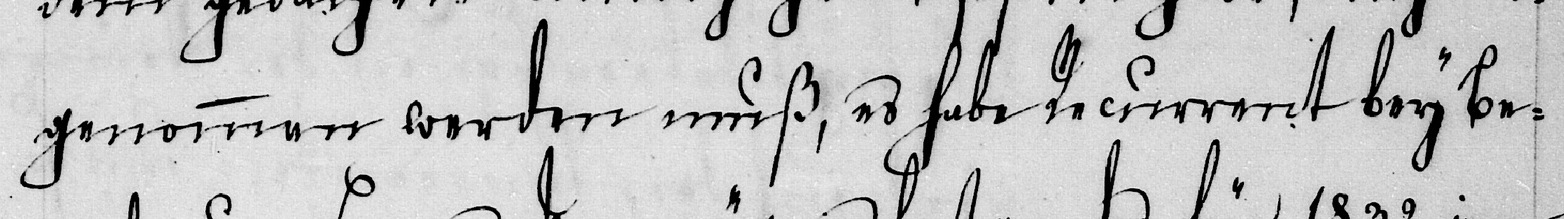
genommen werden muß, es habe Recurrent bey Be¬
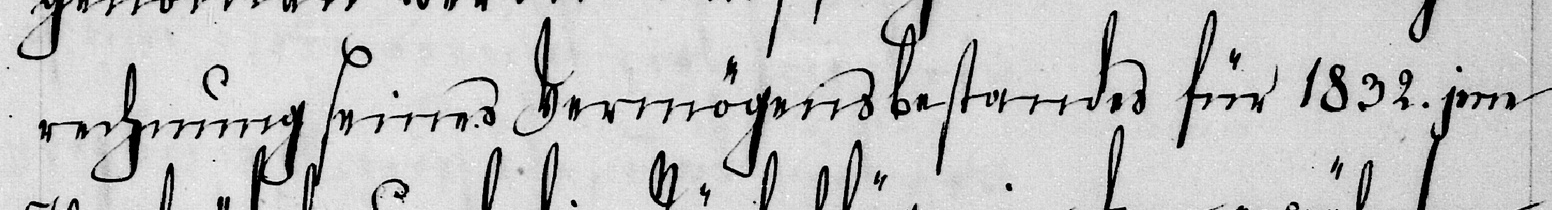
rechnung seines Vermögensbestandes für 1832 jene
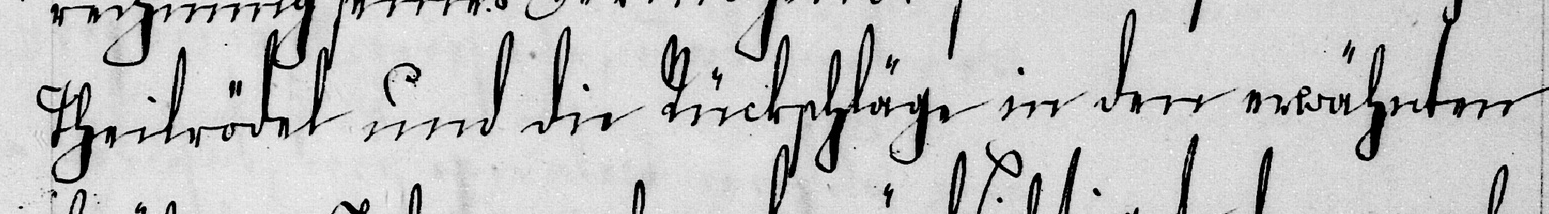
Theilrödel und die Rückschläge in den erwähnten
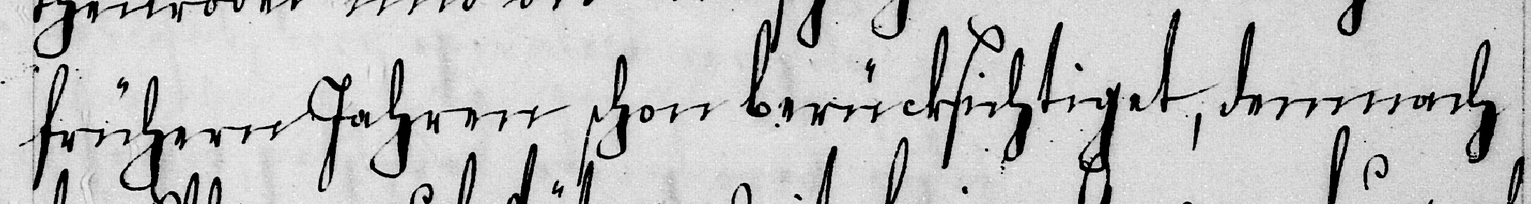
frühern Jahren schon berücksichtiget, demnach
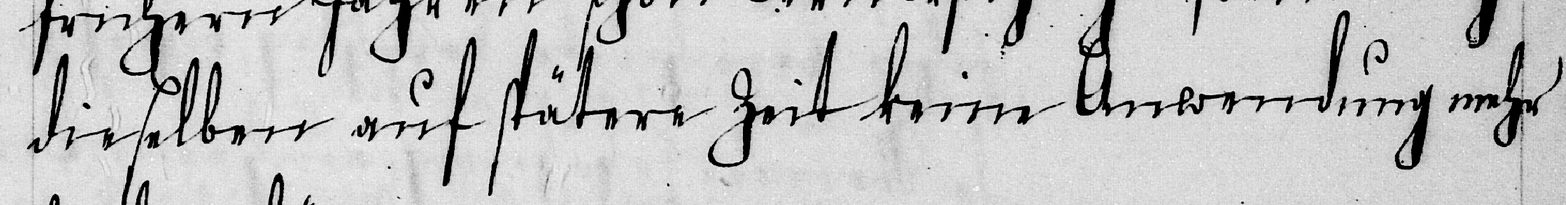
dieselben auf spätere Zeit keine Anwendung mehr
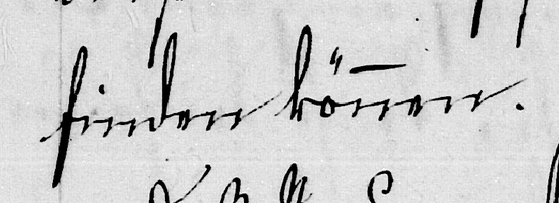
finden können.
